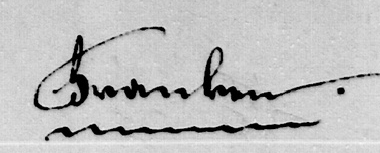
Franken.
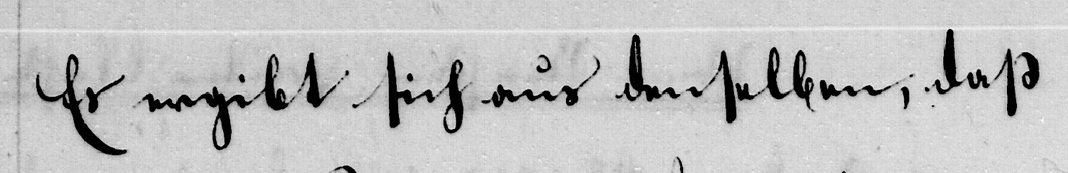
Es ergibt sich aus denselben, daß
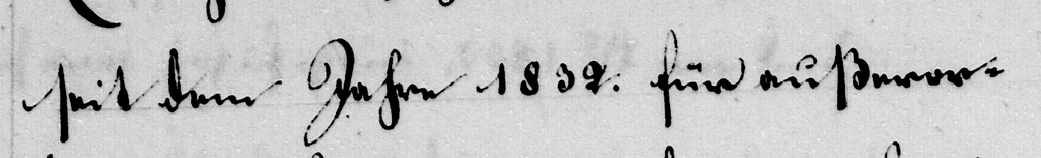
seit dem Jahre 1832. für außeror¬
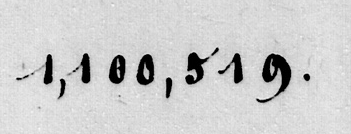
1,100,519.
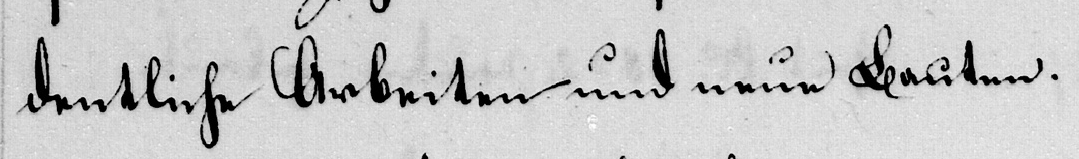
dentliche Arbeiten und neue Bauten
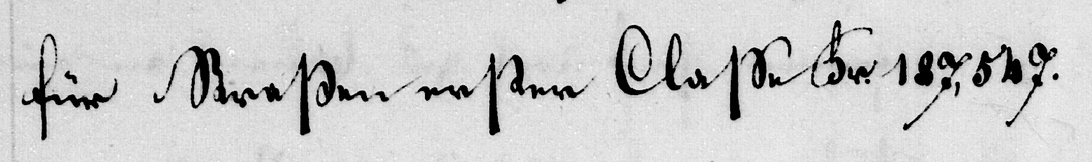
für Straßen erster Claße Fr. 187,547
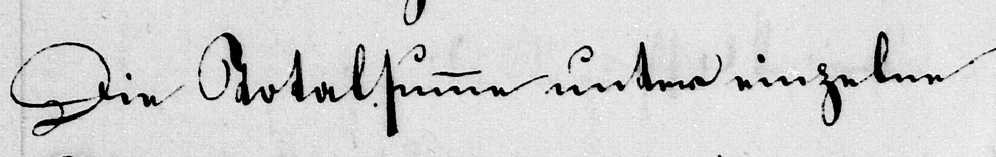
Die Totalsumme unter einzelnen
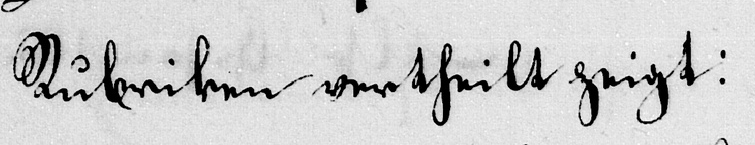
Rubriken vertheilt zeigt:
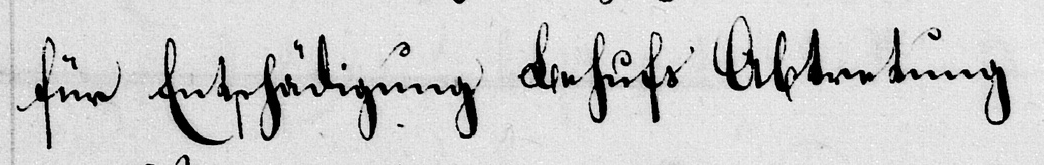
für Entschädigung Behufs Abtretung
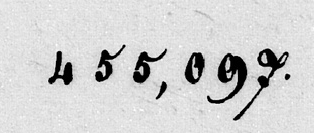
455,097.
